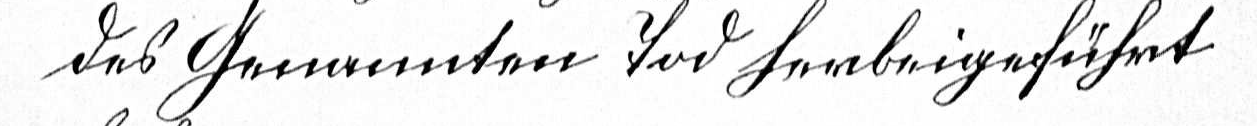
des Genannten Tod herbeigeführt
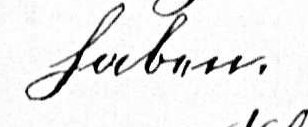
haben.
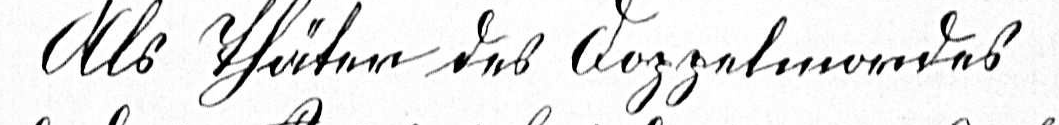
Als Thäter des Doppelmordes
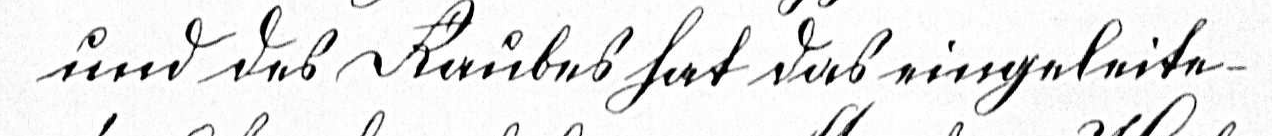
und des Raubes hat das eingeleite¬
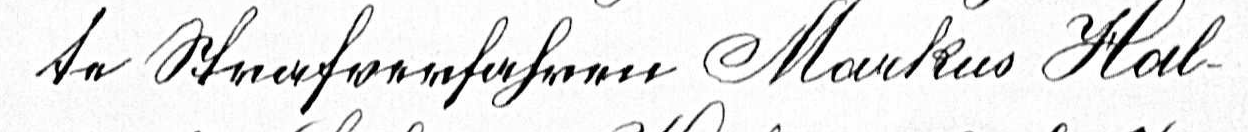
te Strafverfahren Markus Hal¬
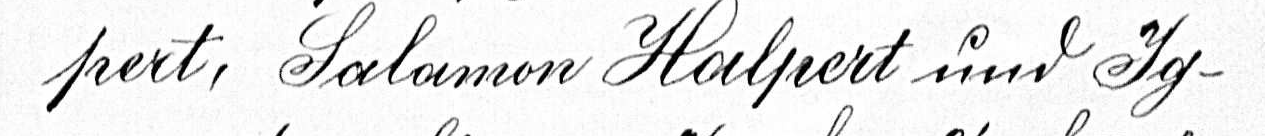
pert, Salamon Halpert und Jg¬
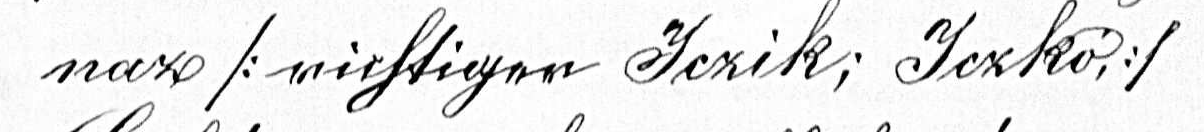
naz /: richtiger Jczik, Jczkó, :/
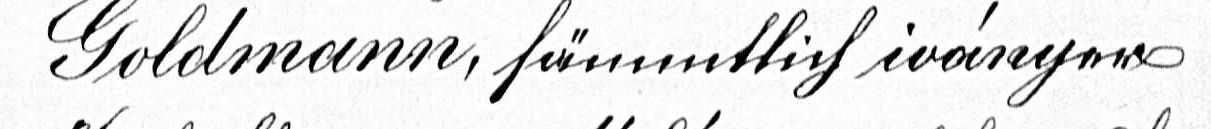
Goldmann, sämmtlich iványer
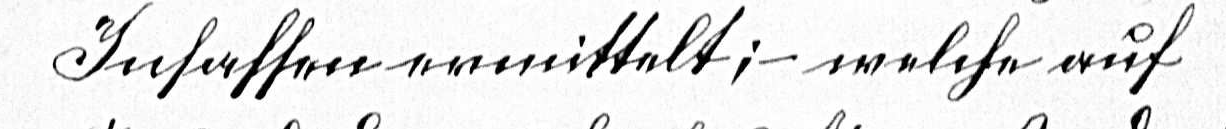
Insassen ermittelt;- welche auf
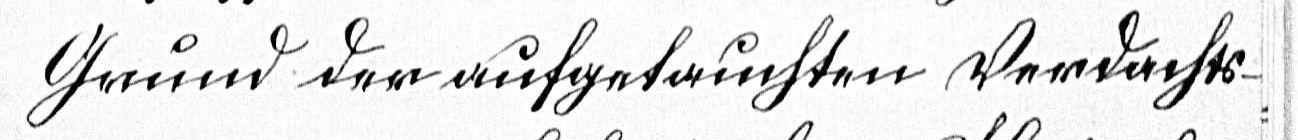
Grund der aufgelauchten Verdachts¬
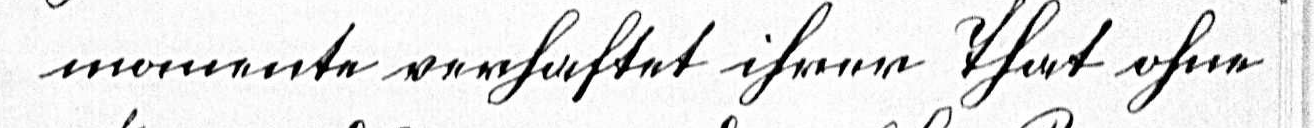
momente verhaftet ihrer That ohne
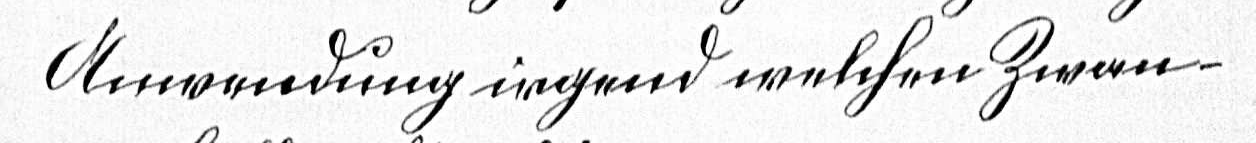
Anwendung irgend welchen Zwan¬
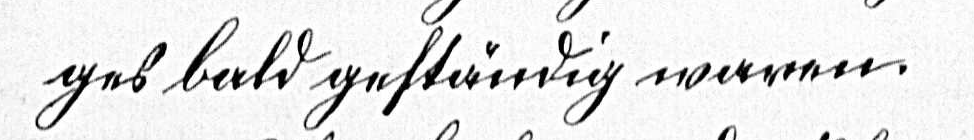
ges bald geständig waren.
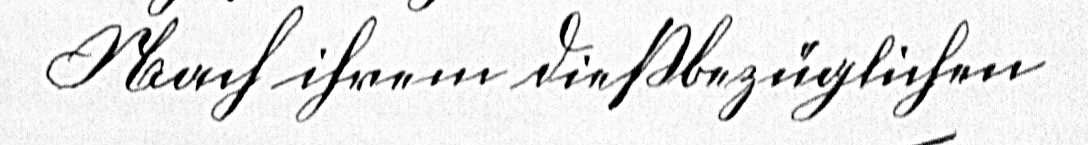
Nach ihrem dießbezüglichen
